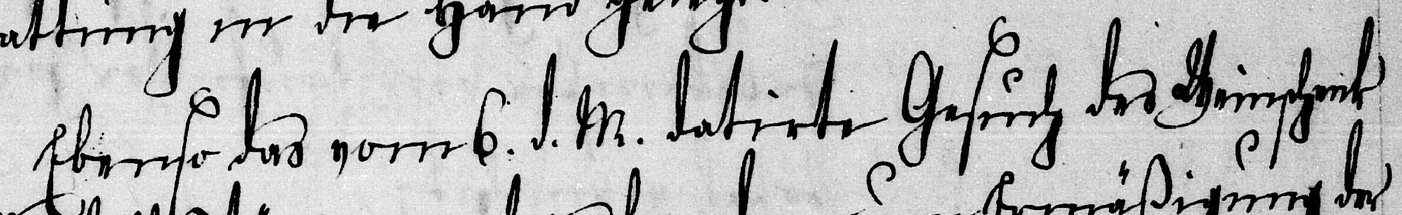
Ebenso das vom 6. v. M. datirte Gesuch des Weinschenk
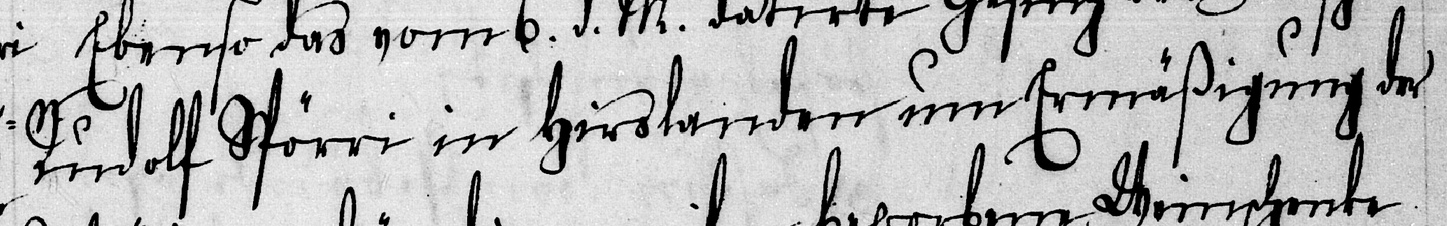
Rudolf Spörri in Hirslanden um Ermäßigung der
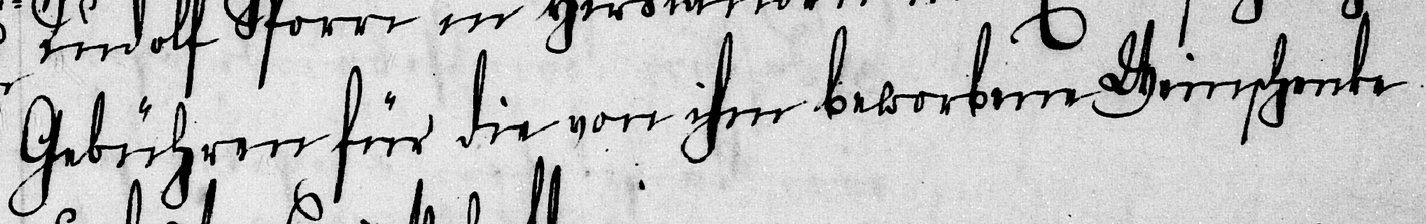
Gebühren für die von ihm beworbene Weinschenke
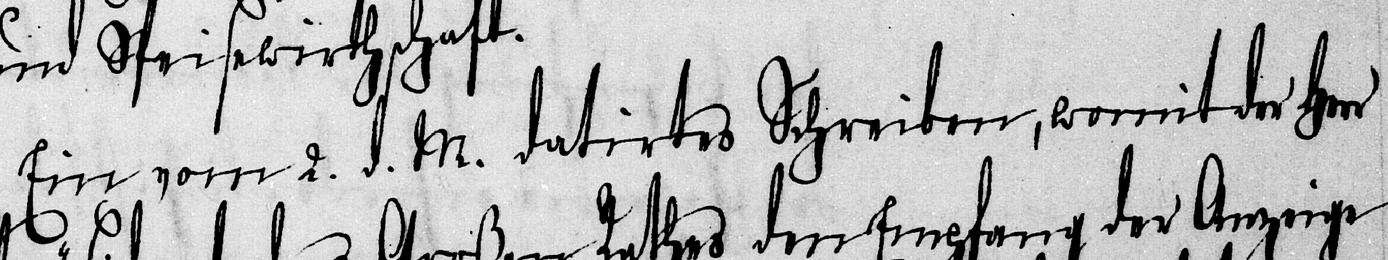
Ein vom 2. d. M. datirtes Schreiben, womit der Herr
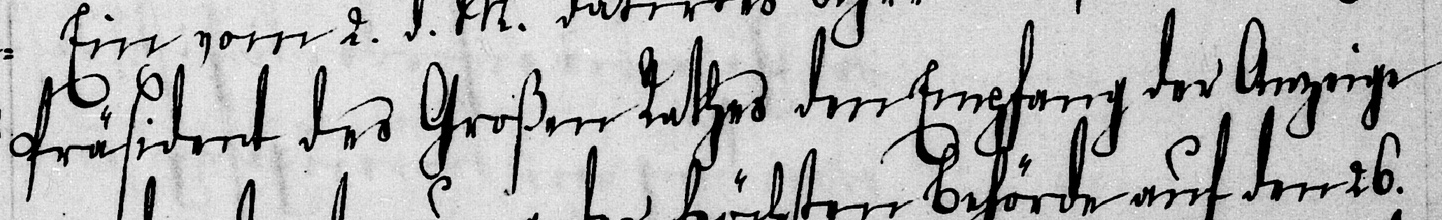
Präsident des Großen Rathes den Empfang der Anzeige
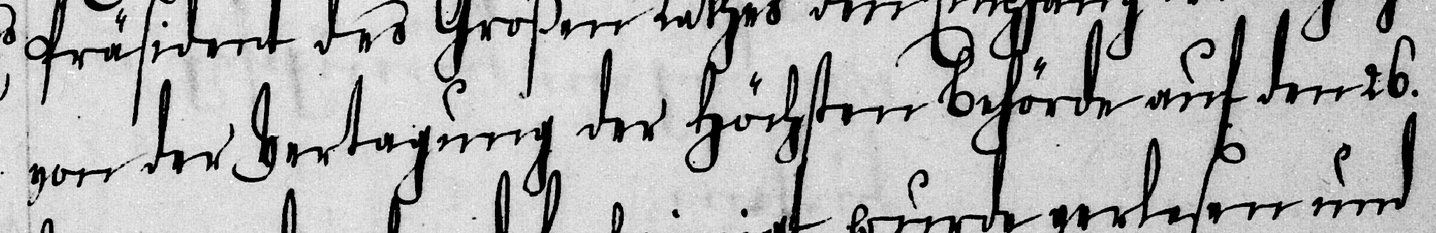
von der Vertagung der Höchsten Behörde auf den 26.
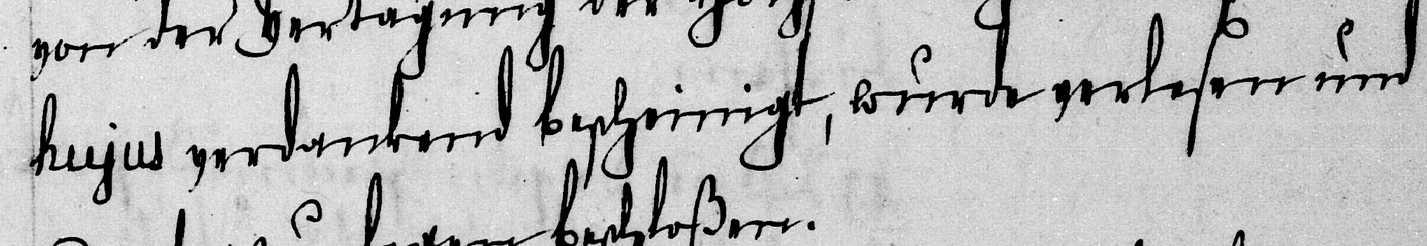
hujus verdankend bescheinigt, wurde verlesen und
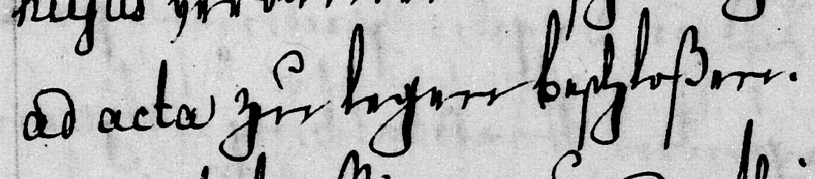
ad acta zu legen beschloßen.
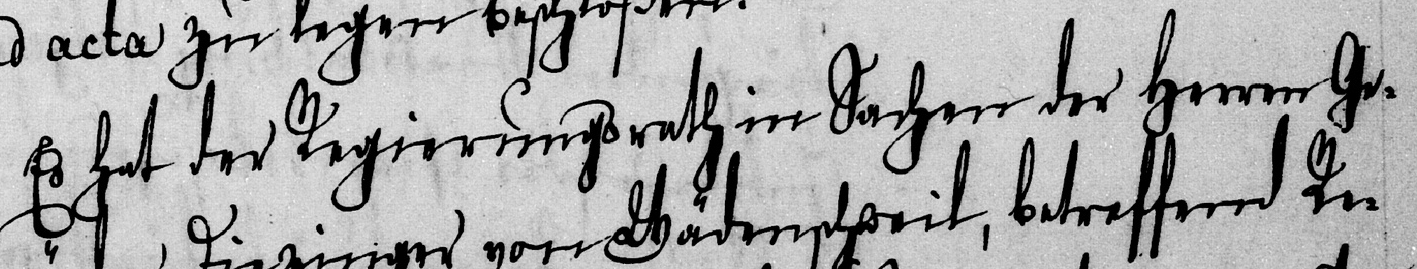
Es hat der Regierungsrath in Sachen der Herren Geb¬
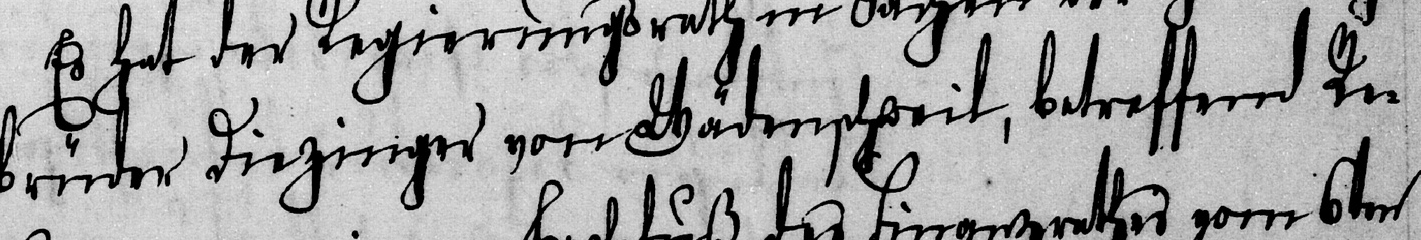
rüder Diezinger von Wädenschweil, betreffend Re¬
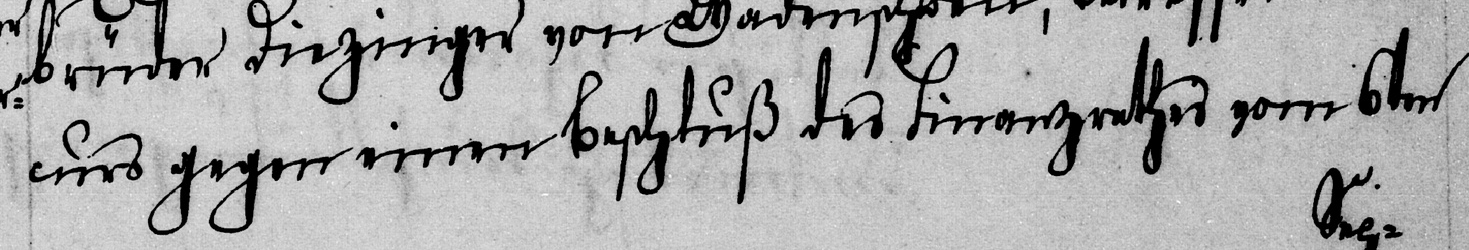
curs gegen einen Beschluß des Finanzrathes vom 6ten
